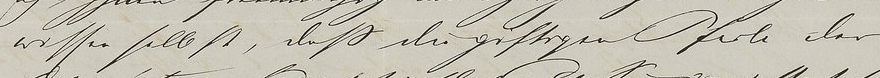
wissen selbst, daß die giftigen Pfeile der
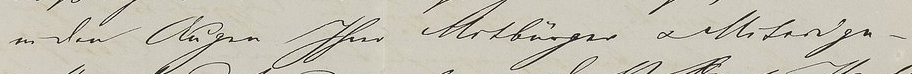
in den Augen Ihrer Mitbürger & Miteidge-
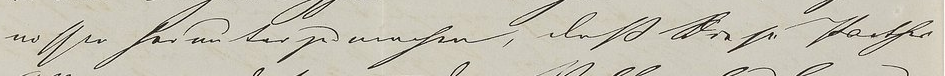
nossen herunterzumachen, daß diese Parthei
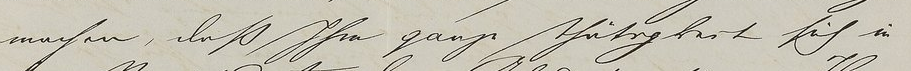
machen, daß Ihre ganze Thätigkeit sich in
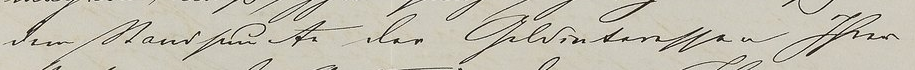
dem Standpuncte der Geldinteressen Ihrer
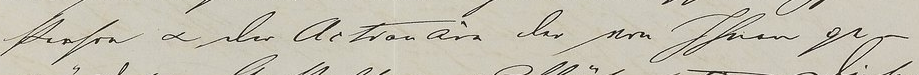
Person & der Actionäre der von Ihnen ge-
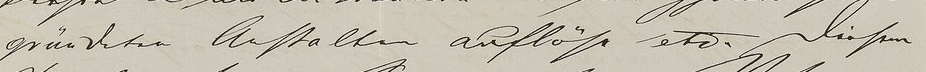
gründeten Anstalten auflöse etc. Diesem
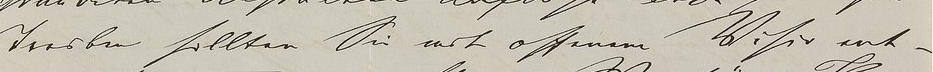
Treiben sollten Sie mit offenem Visir ent-
